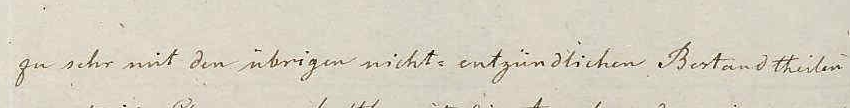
zu sehr mit den übrigen nicht-entzündlichen Bestandtheilen
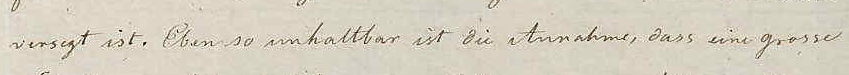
versezt ist. Eben so unhaltbar ist die Annahme, dass eine grosse
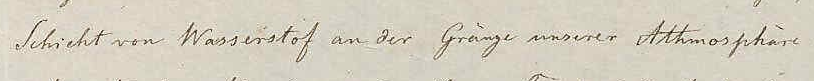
Schicht von Wasserstof an der Gränze unserer Athmosphäre
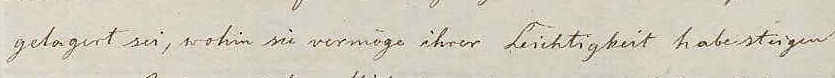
gelagert sei, wohin sie vermöge ihrer Leichtigkeit habe steigen
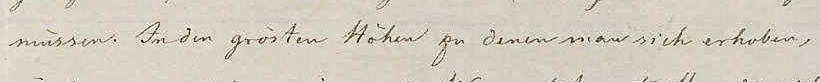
müssen. In den grösten Höhen zu denen man sich erhoben,
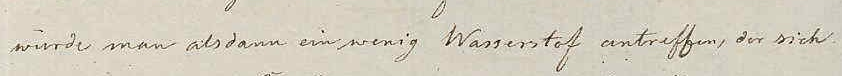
würde man alsdann ein wenig Wasserstof antreffen, der sich
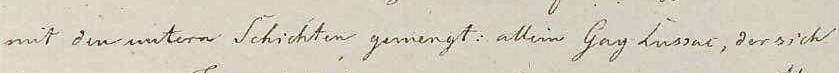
mit den untern Schichten gemengt: allein Gay Lussac, der sich
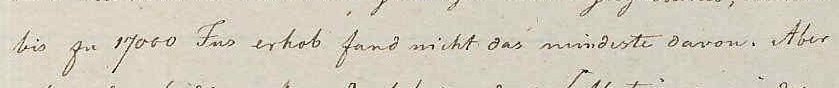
bis zu 17000 Fus erhob fand nicht das mindeste davon. Aber
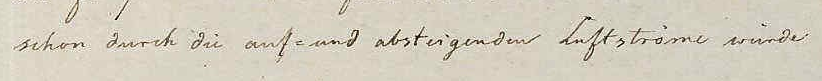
schon durch die auf- und absteigenden Luftströme würde
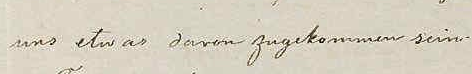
uns etwas davon zugekommen sein.
